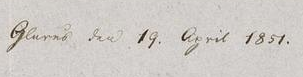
Glarus den 19. April 1851.
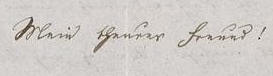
Mein theurer Freund!
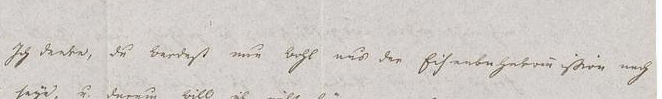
Ich denke, Du werdest nun wohl aus der Eisenbahnkommission nach
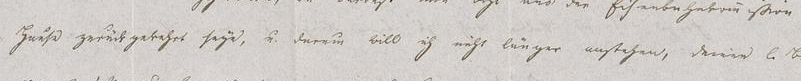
Hause zurückgekehrt seyn, u. darum will ich nicht länger anstehen, Deinen l.
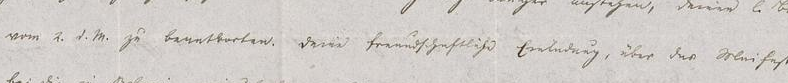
vom 2. d. M. zu beantworten. Deine freundschaftliche Einladung, über das Maifest
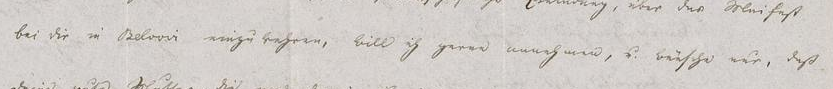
bei Dir in Belvoir einzukehren, will ich gerne annehmen, u. wünsche nur, daß
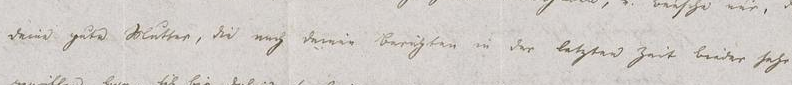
Deine gute Mutter, die nach Deinen Berichten in der letzten Zeit wieder sehr
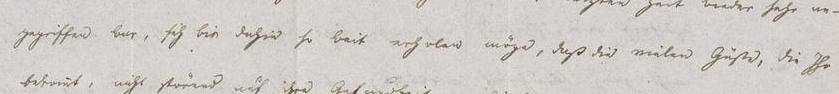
gegriffen war, sich bis dahin so weit erholen möge, dass die vielen Gäste, die Ihr
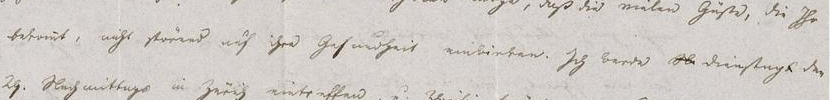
bekommt, nicht störend auf ihre Gesundheit einwirken. Ich werde MDienstags den
